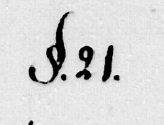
§. 21.
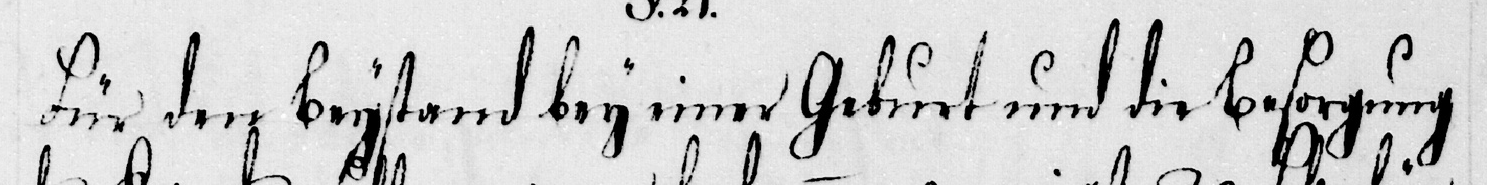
Für den Beystand bey einer Geburt und die Besorgung
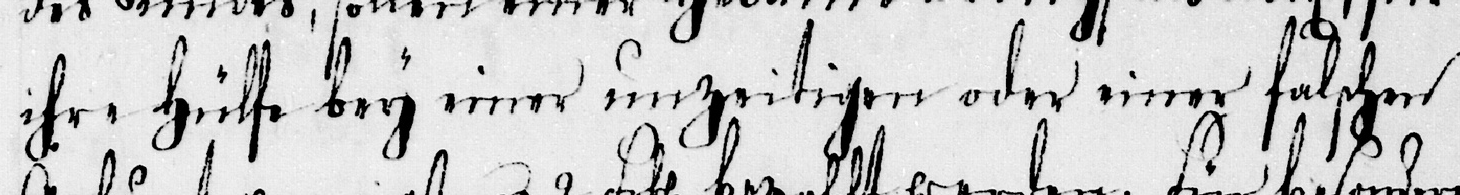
ihre Hülfe bey einer unzeitigen oder einer falschen
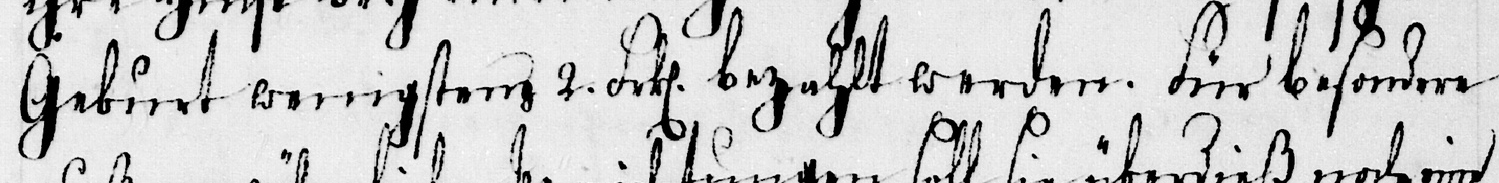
Geburt wenigstens 2. Frk[en]. bezahlt werden. Für besondere
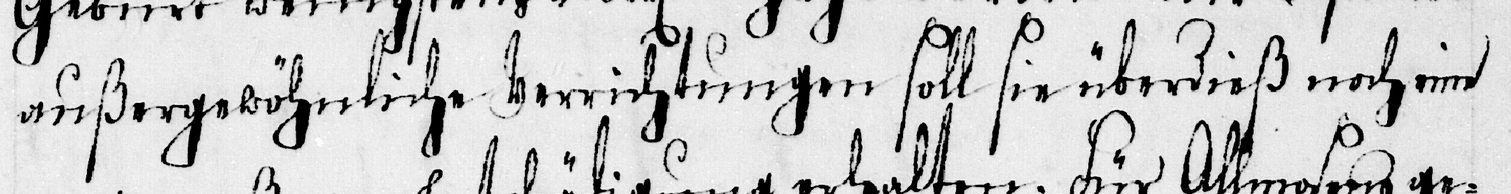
außergewöhnliche Verrichtungen soll sie überdieß noch eine
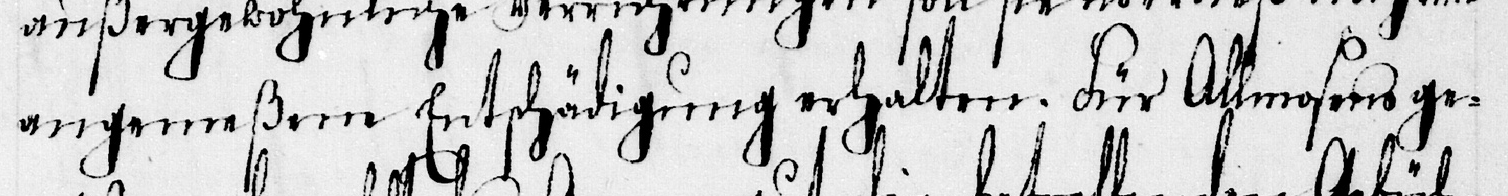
angemeßene Entschädigung erhalten. Für Allmosensge¬
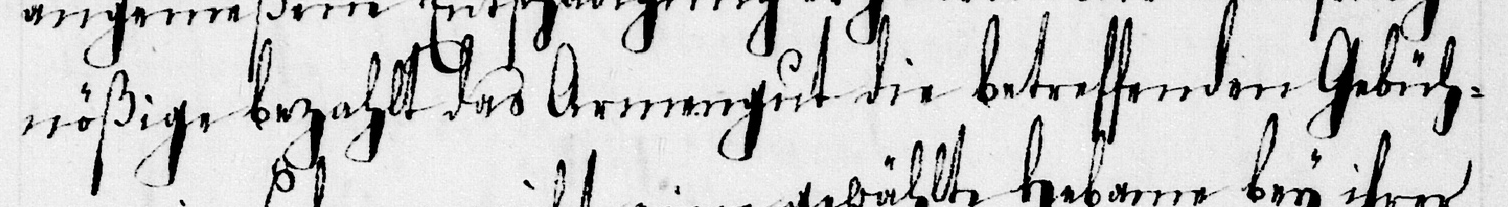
nößige bezahlt das Armengut die betreffenden Gebüh¬
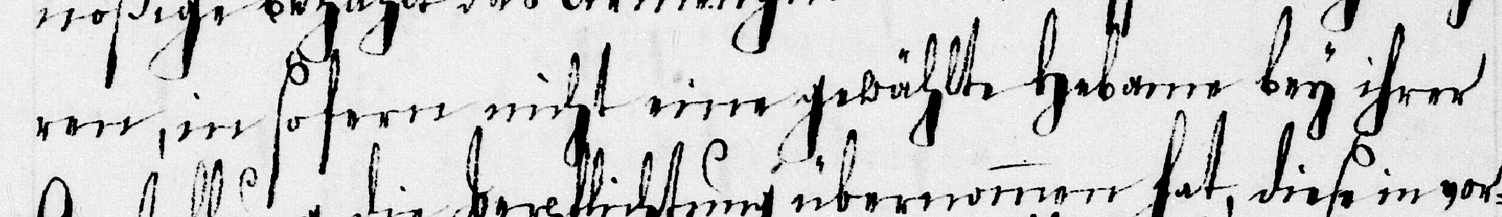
ren, in so fern nicht eine gewählte Hebam[m]e bey ihrer
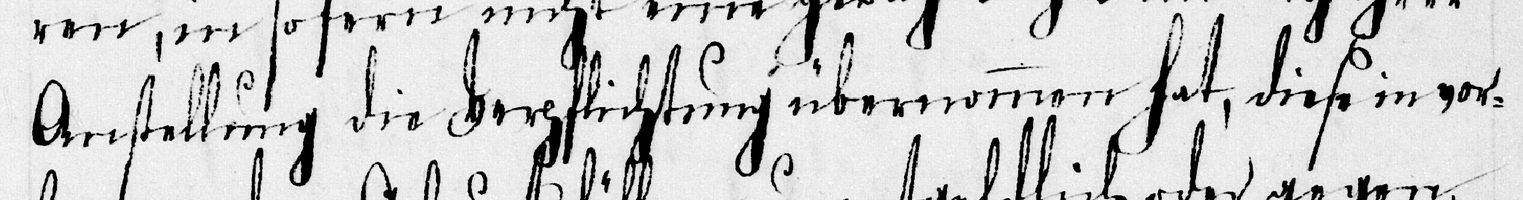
Anstellung die Verpflichtung übernommen hat, diese in vor¬
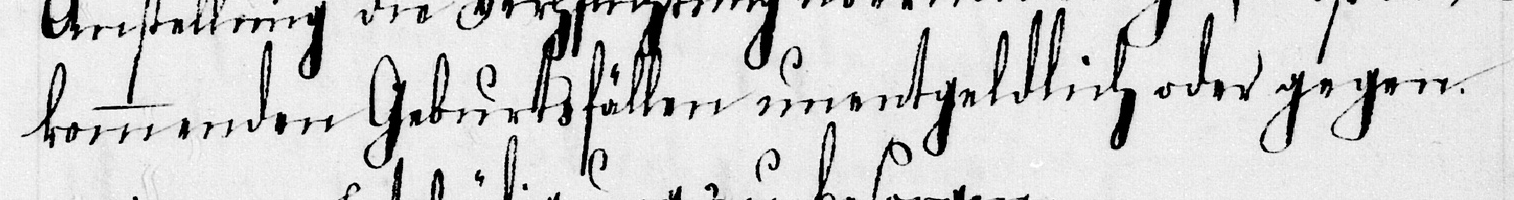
kommenden Geburtsfällen unentgeldlich oder gegen
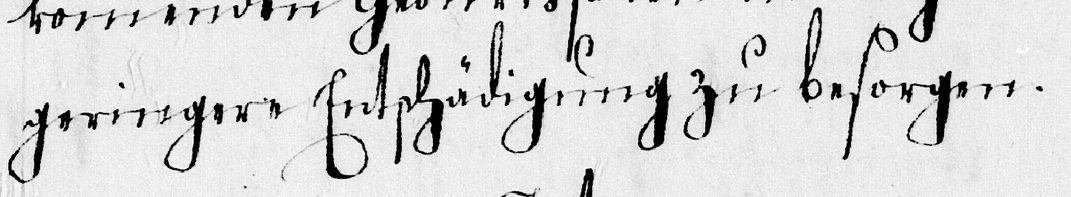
geringere Entschädigung zu besorgen.
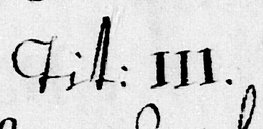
Tit: III.
